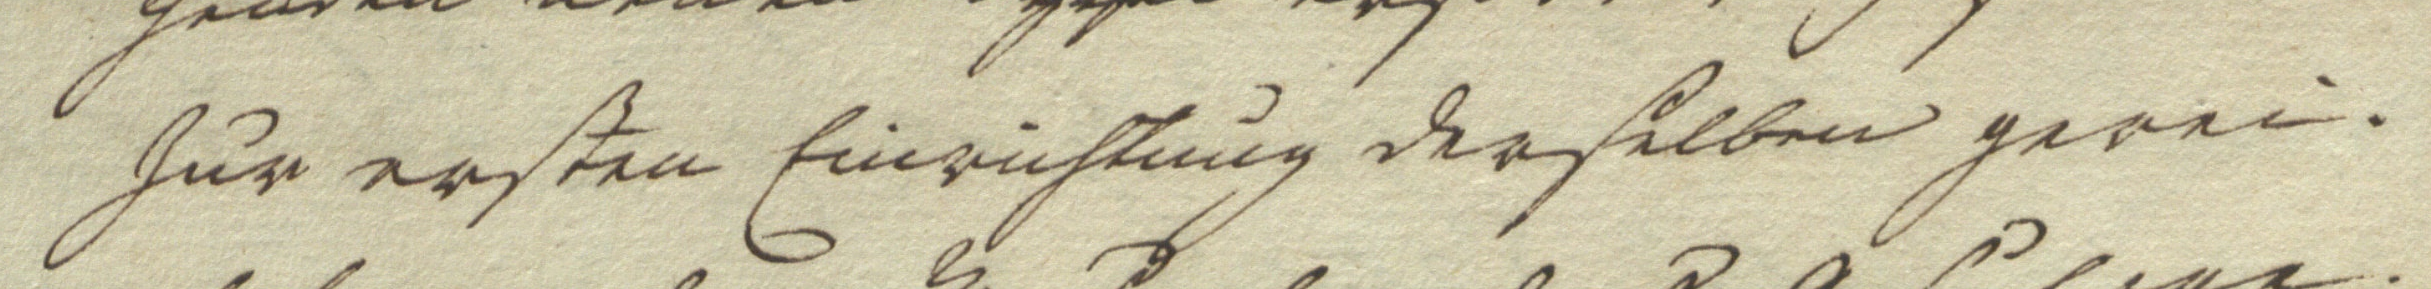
zur ersten Einrichtung derselben gerei¬
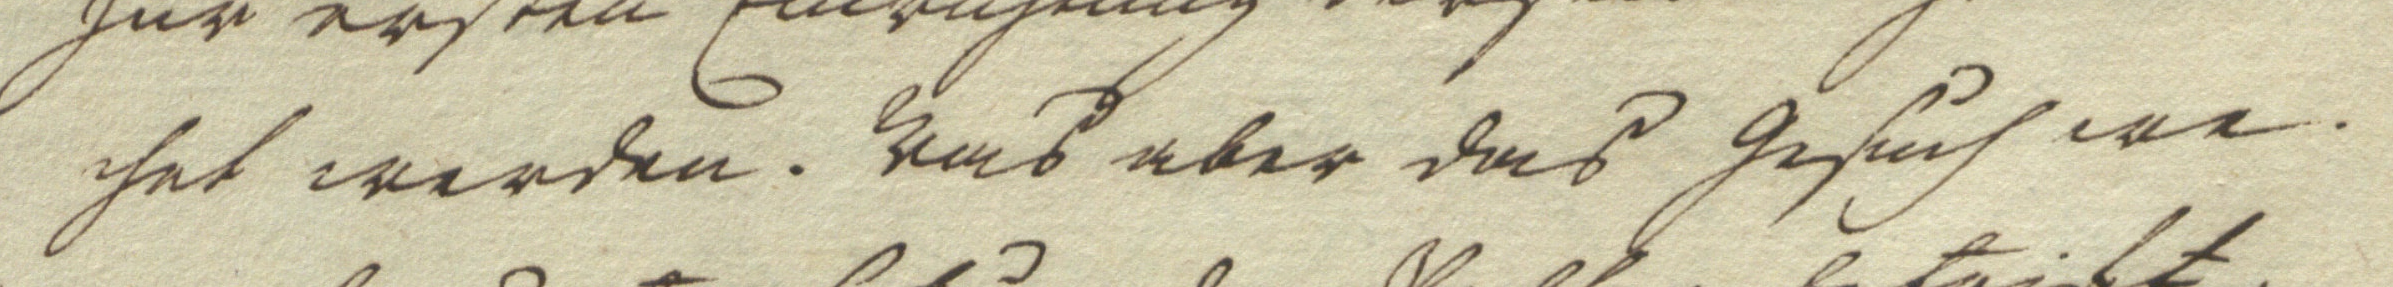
chet werden. Was aber das Gesuch we¬
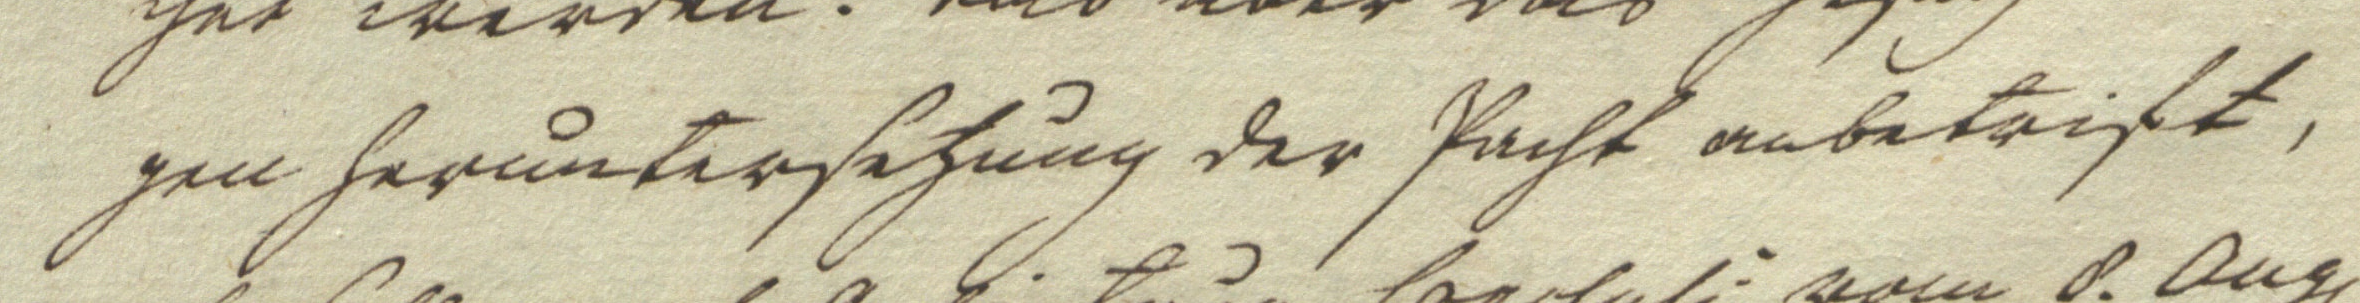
gen Heruntersetzung der Pacht anbetrift,
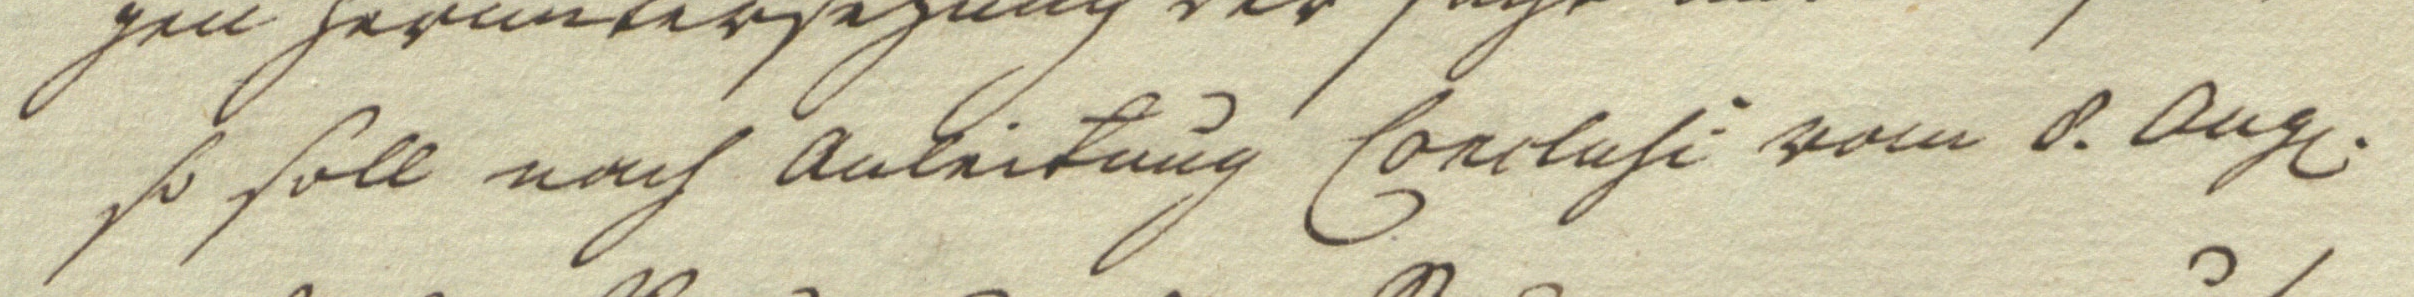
so soll nach Anleitung Conclusi vom 8. Aug.
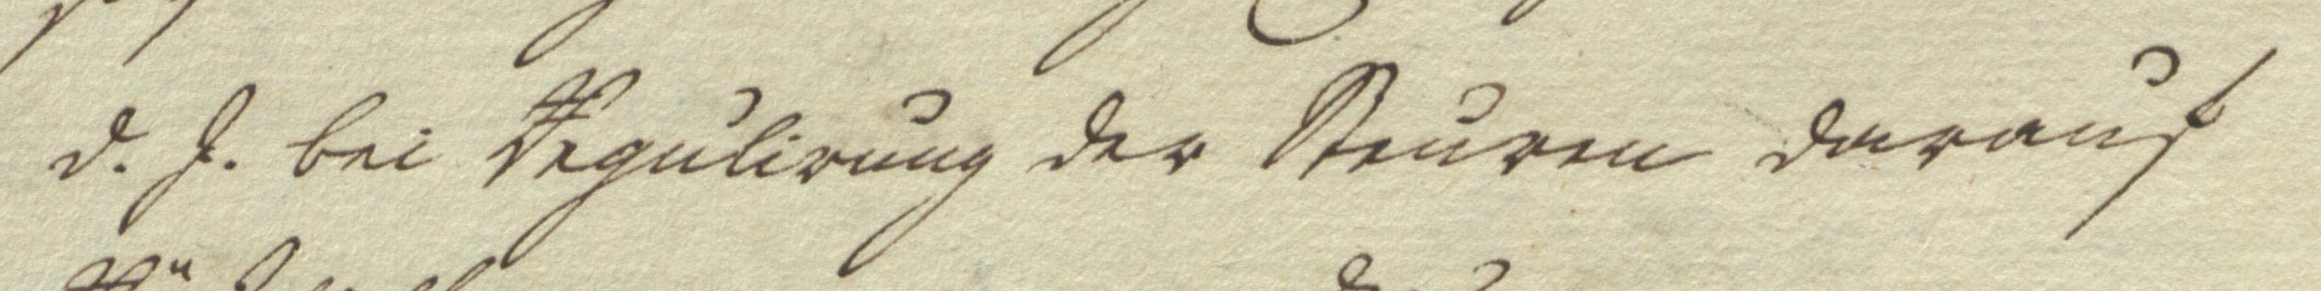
d. J. bei Regulirung der Steuren darauf
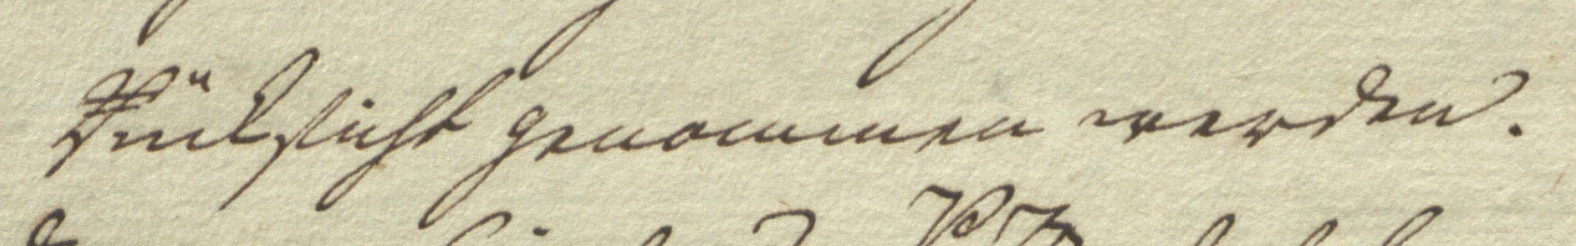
Rücksicht genommen werden.
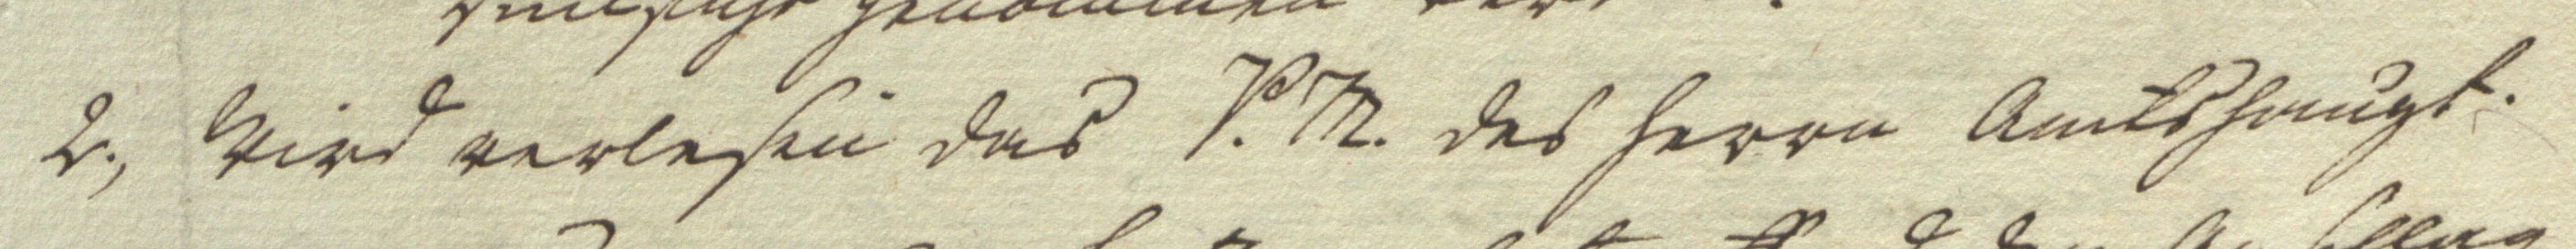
2., Wird verlesen das P. M. des Herrn Amtshaupt¬
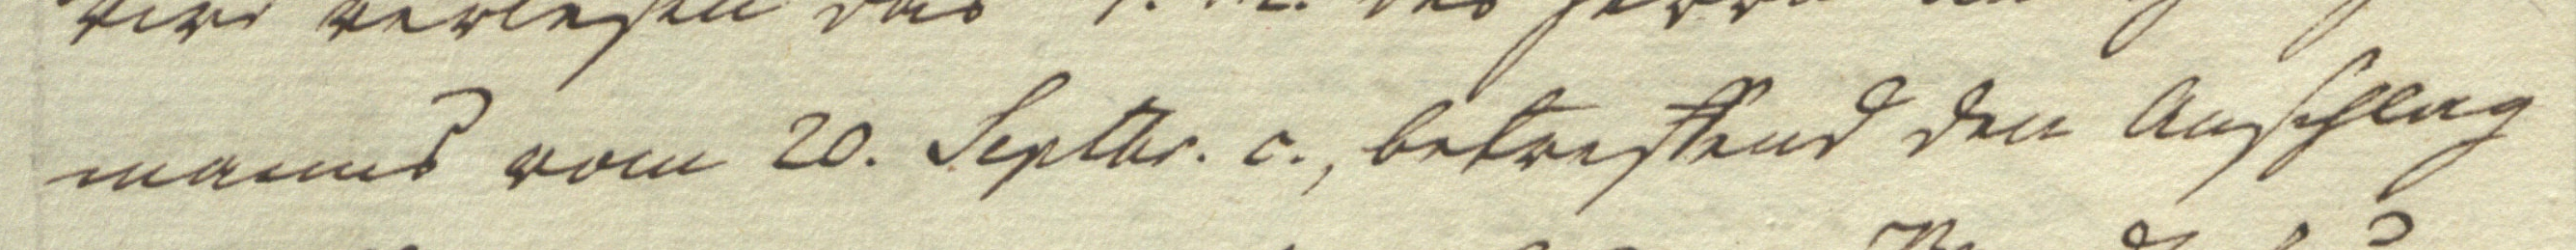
manns vom 20. Septbr. c., betreffend den Anschlag
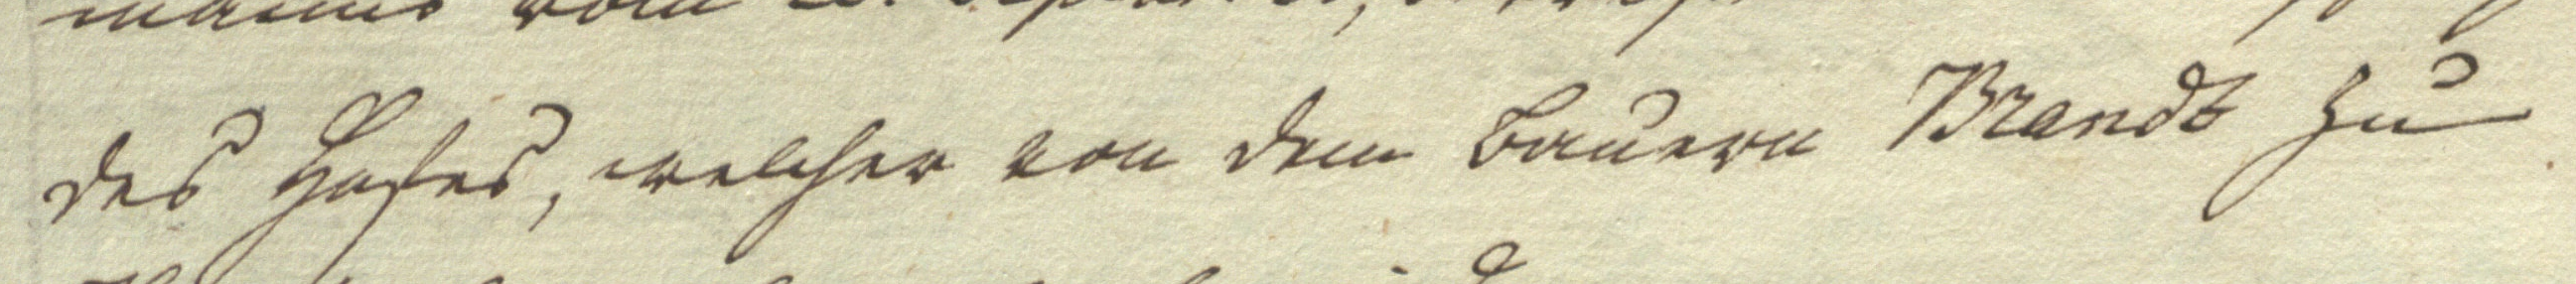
des Hofes, welcher von dem Bauern Brandt zu
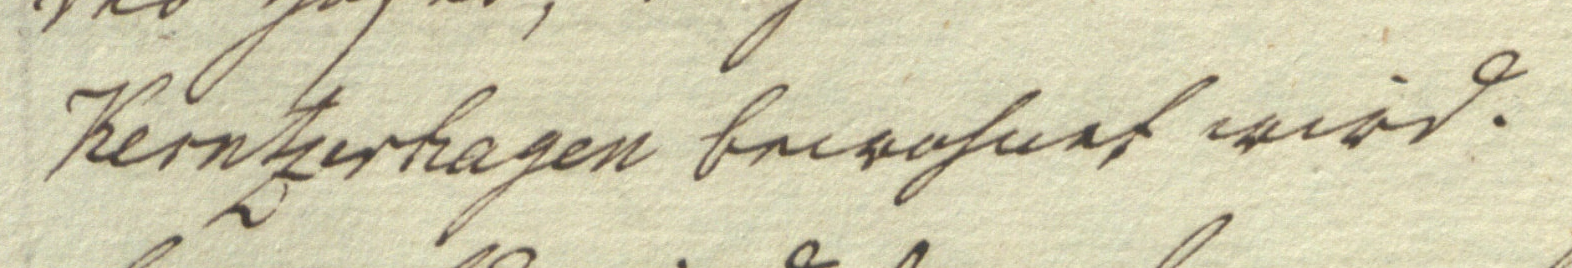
Kemtzerhagen bewohnet wird.
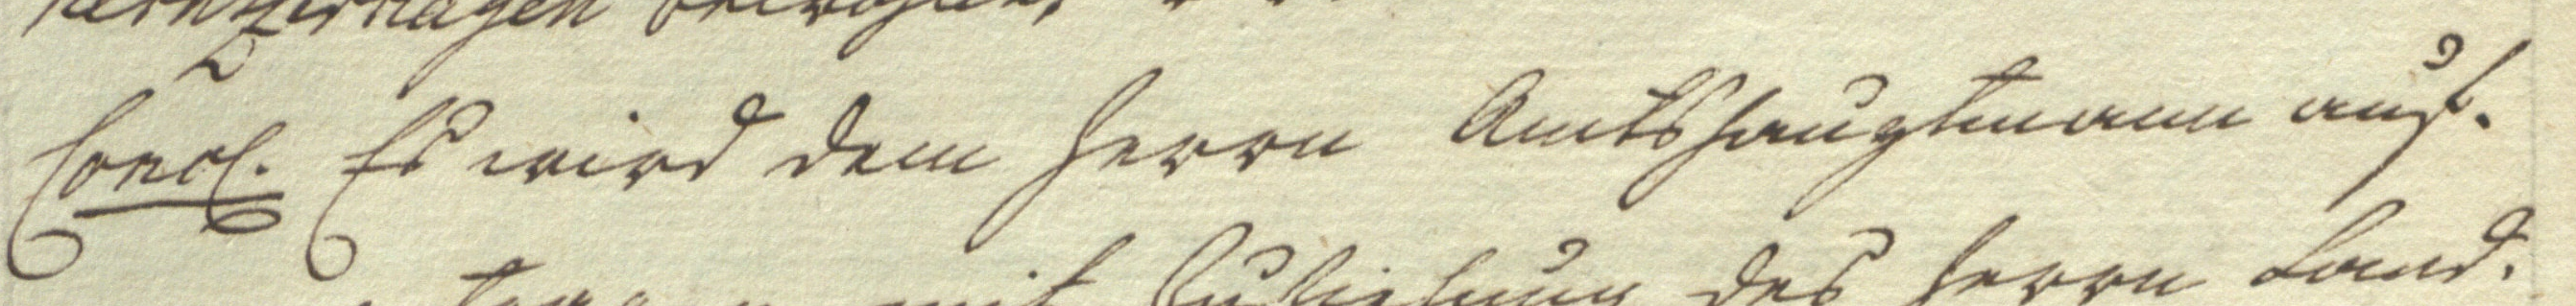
Concl. Es wird dem Herrn Amtshauptmann auf¬
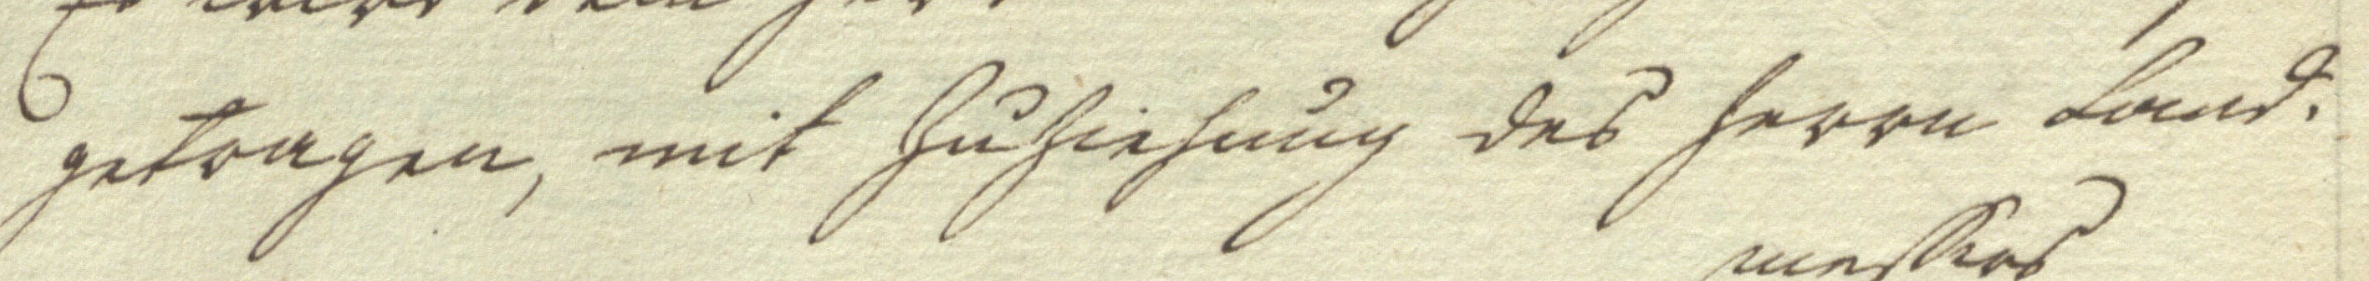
getragen, mit Zuziehung des Herrn Land¬
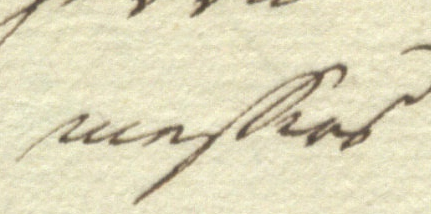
messers
